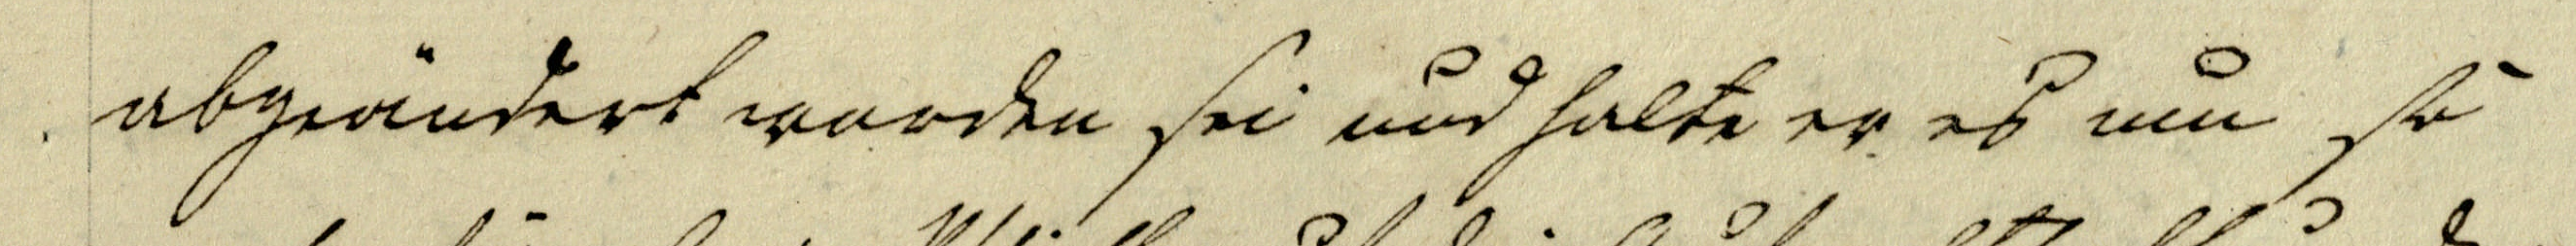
abgeändert worden sei und halte er es um so
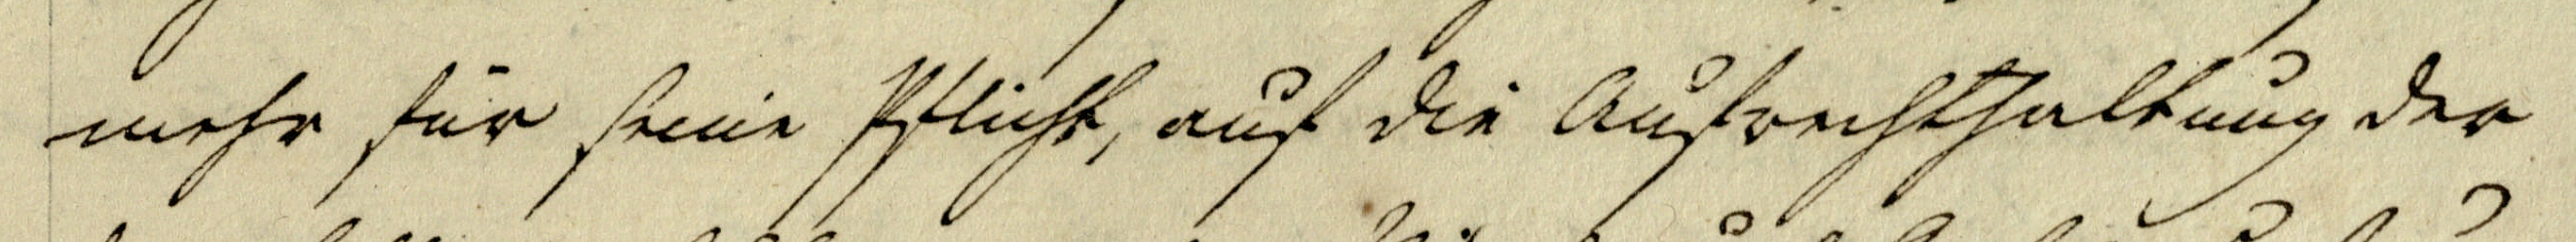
mehr für seine Pflicht, auf die Aufrechthaltung der
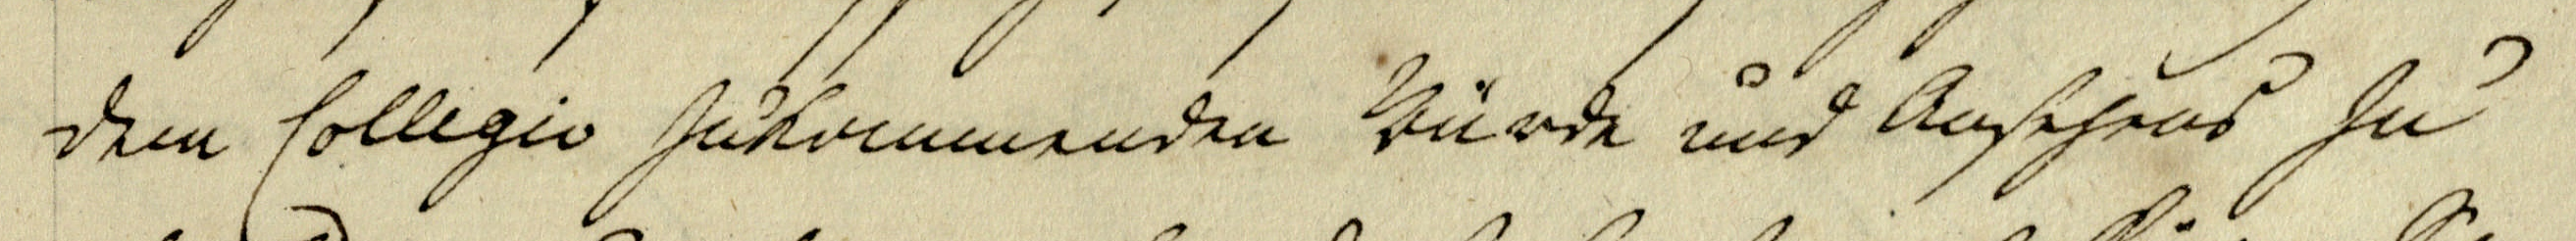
dem Collegio zukommenden Würde und Ansehens zu
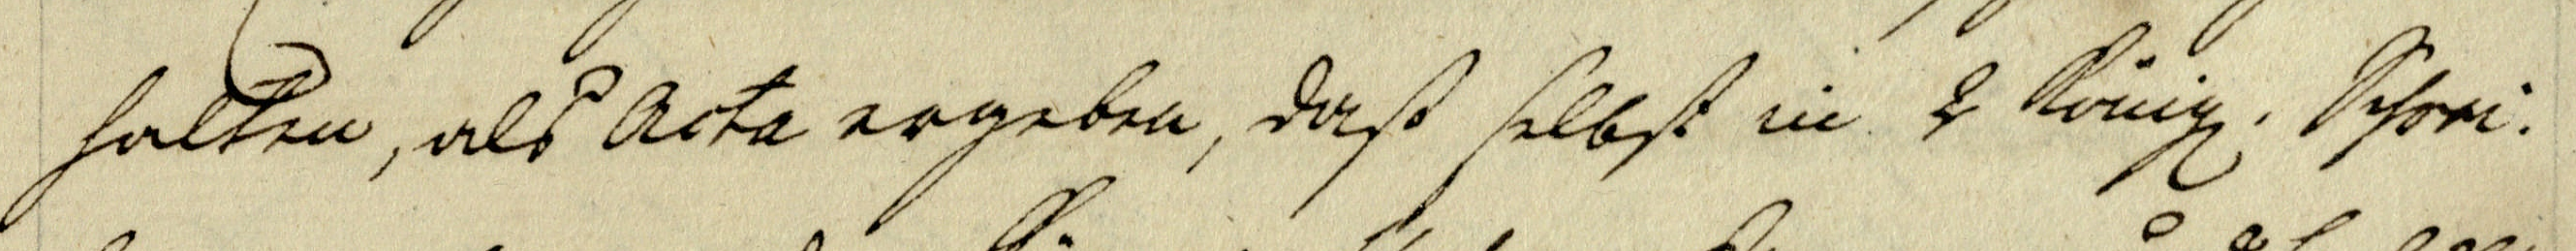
halten, als Acta ergeben, daß selbst in 2 Königl. Schrei¬
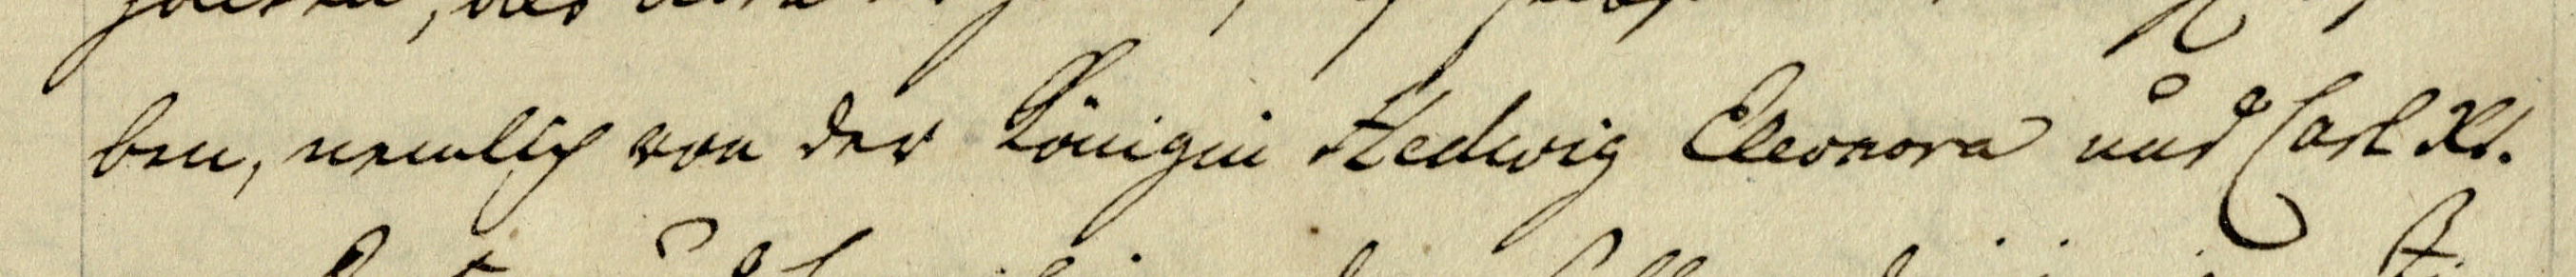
ben, nemlich von der Königin Hedwig Eleonore und Carl XI.
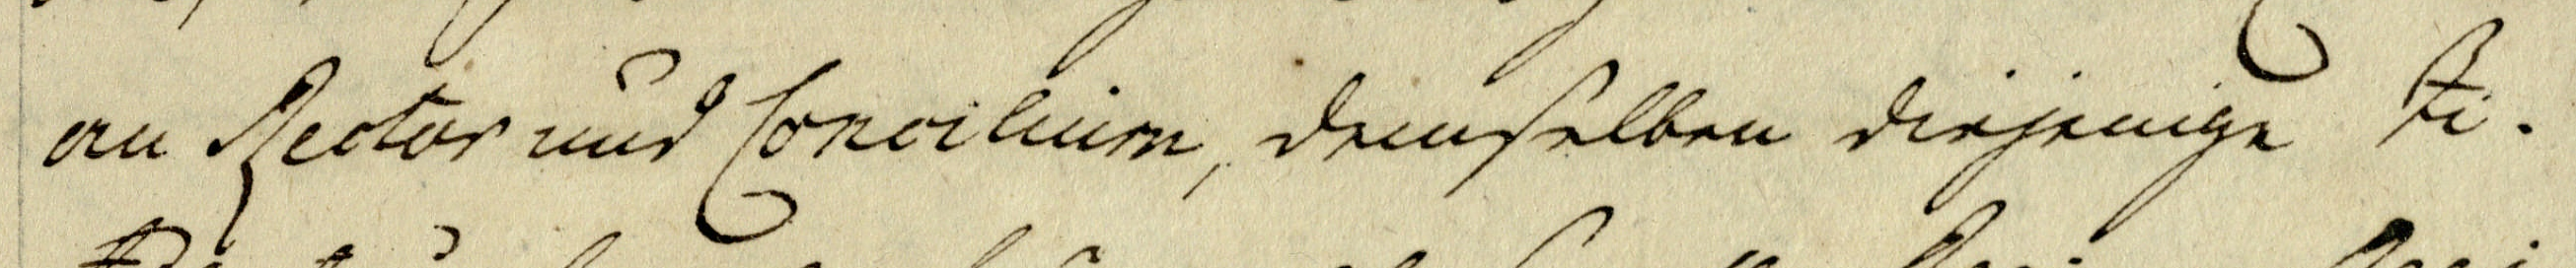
an Rector und Concilium, demselben diejenige Ti¬
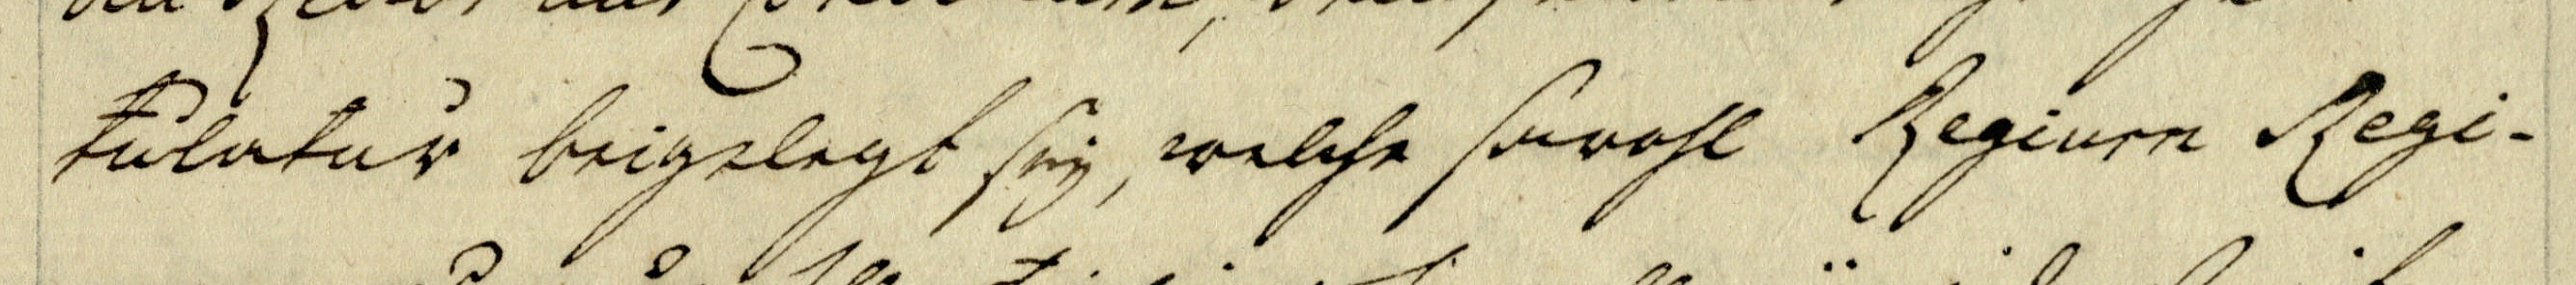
tulatur beigelegt seÿ, welche sowohl Rigium Regi¬
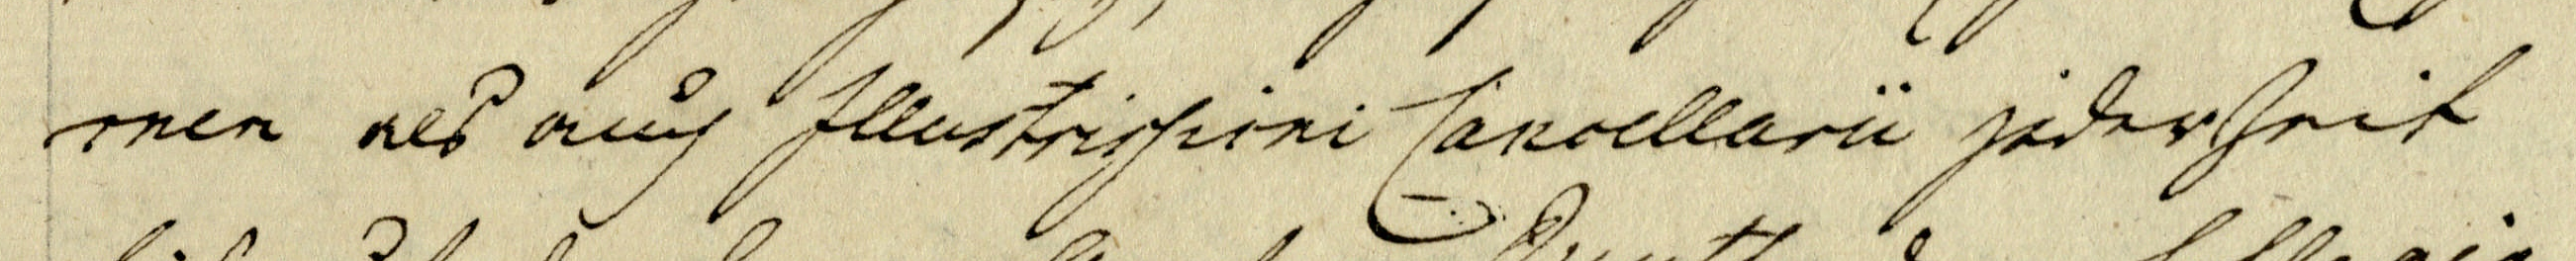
men als auch Illustrissimi Cancellarii jederzeit
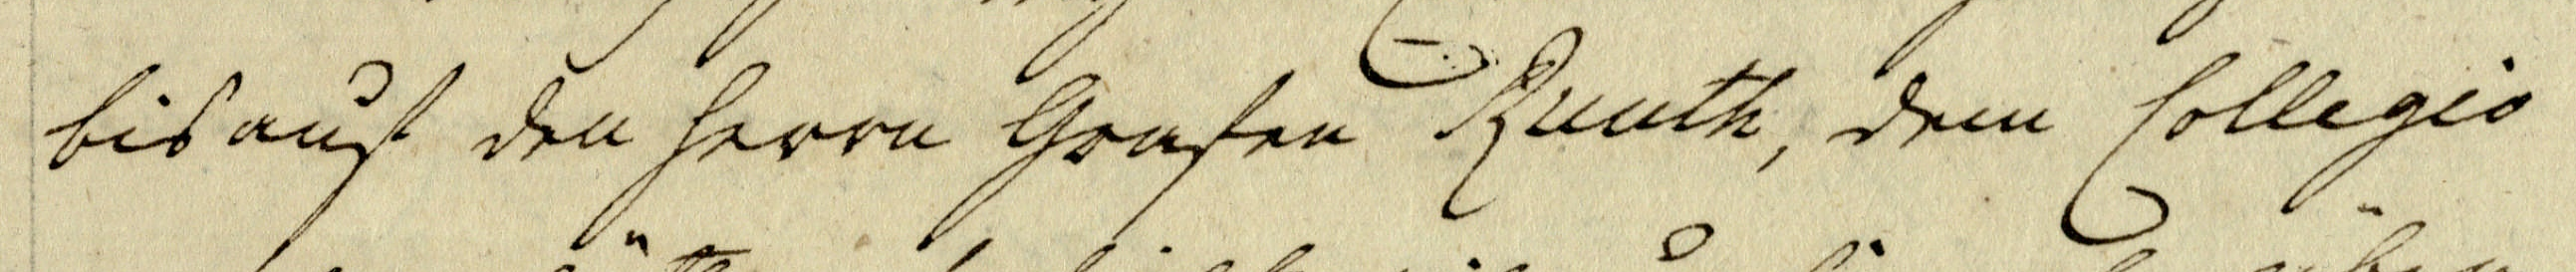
bis auf den Herrn Grafen Ruuth, dem Collegio
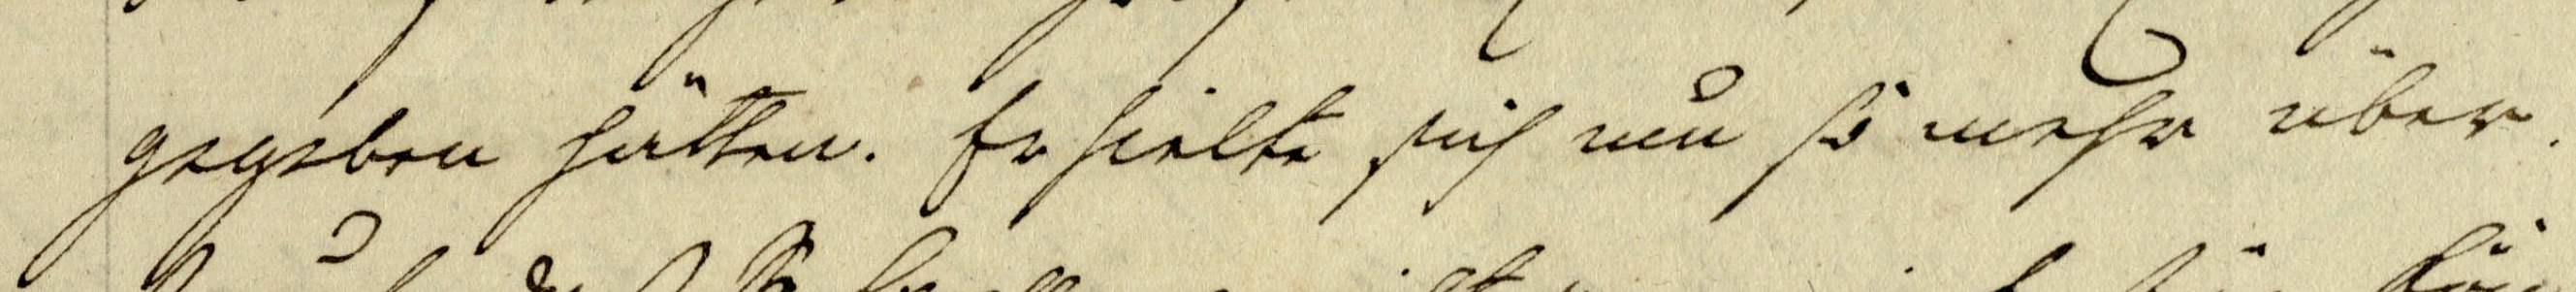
gegeben hätten. Er hielte sich um so mehr über¬
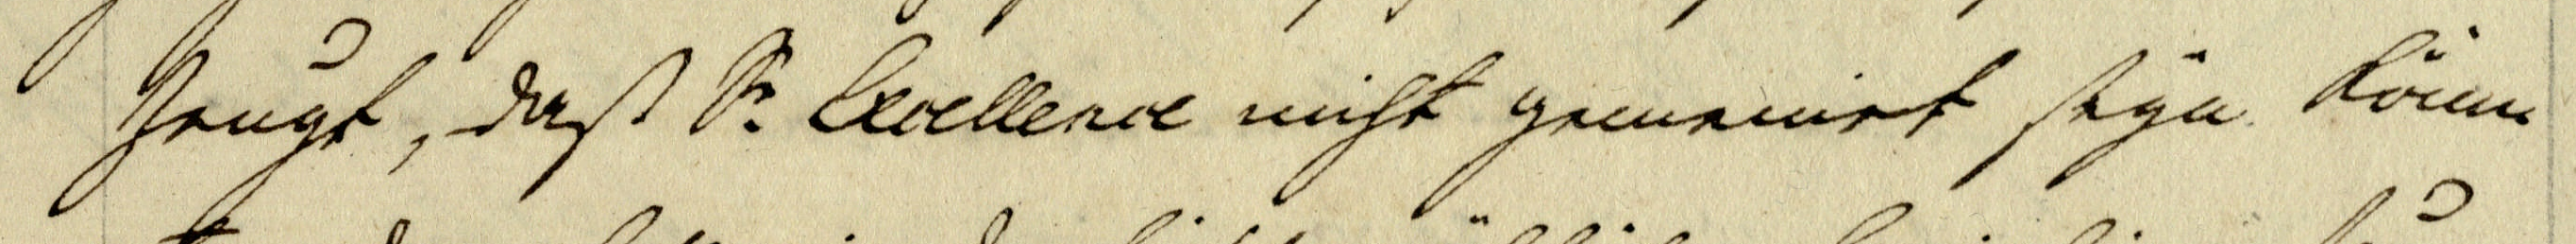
zeugt, daß Sr. Excellence nicht gemeinet seÿn könn¬
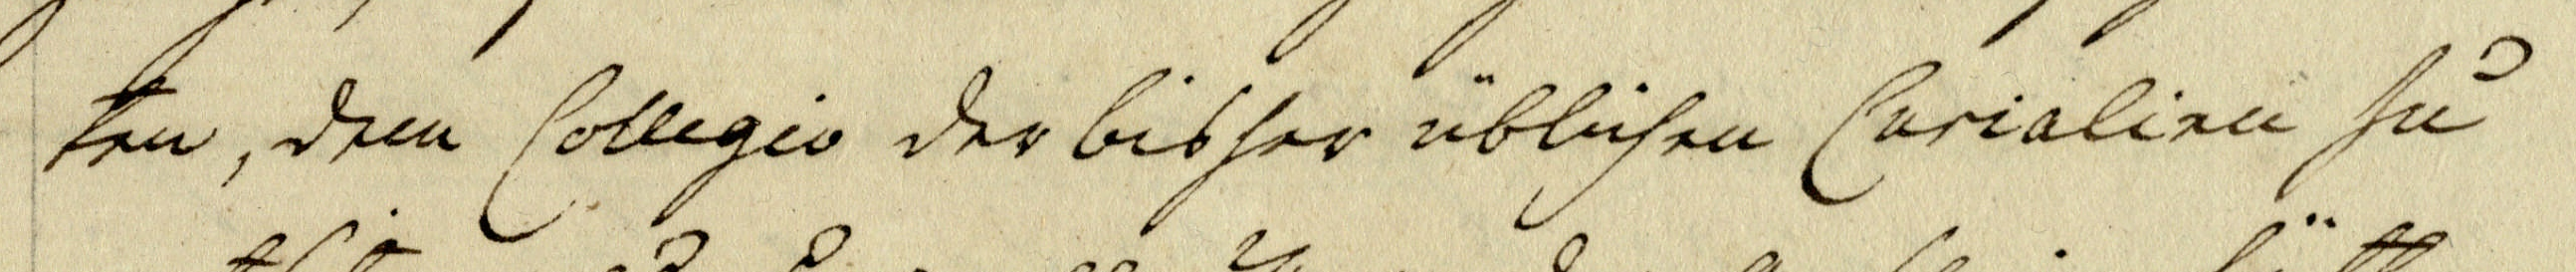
ten, dem Collegio der bisher üblichen Curialien zu
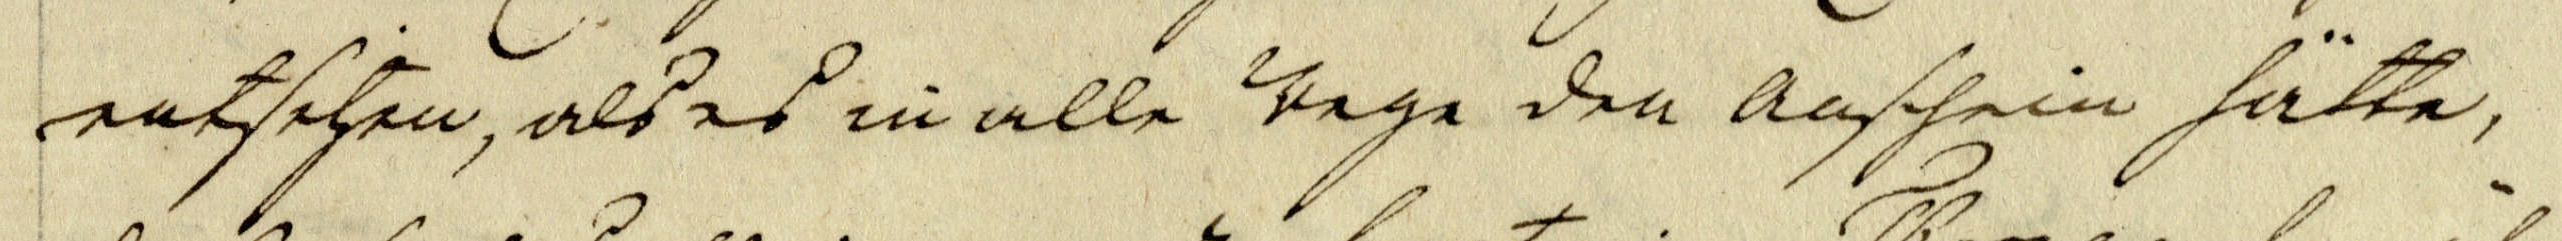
entsetzen, als es in alle Wege den Anschein hätte,
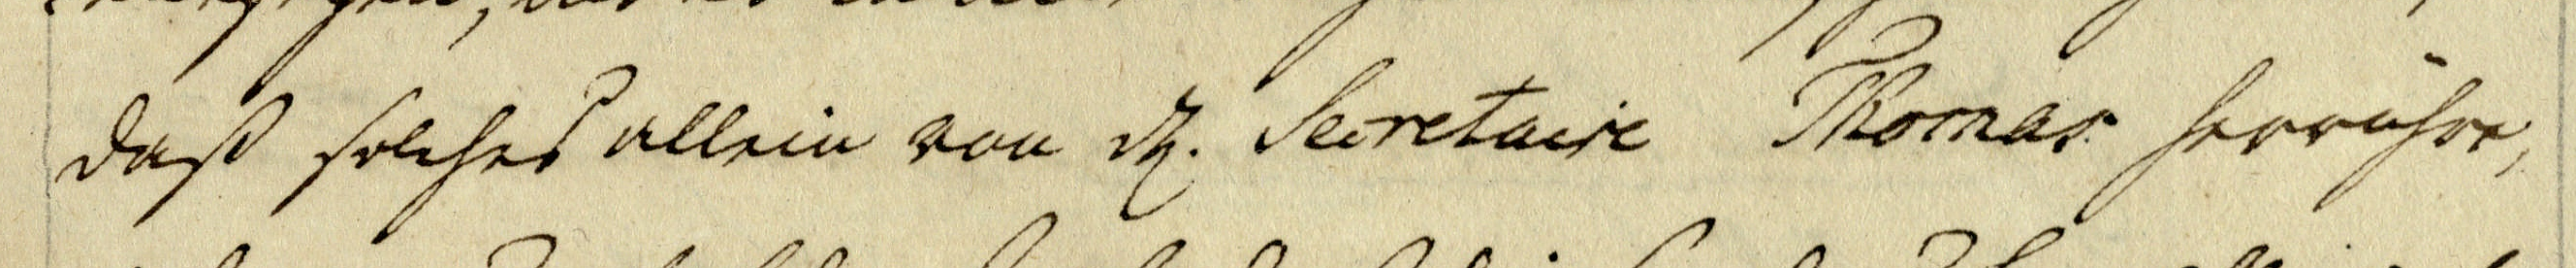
daß solches allein von dh. Secretaire Thomas herrühre,
